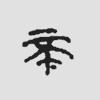不
